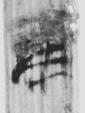民
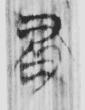有
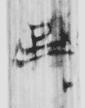甬
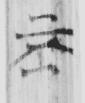不
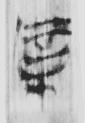厚
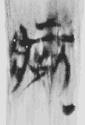{爿死}
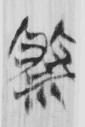膴
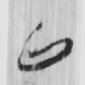㠯（以）
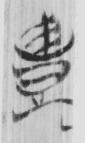豊
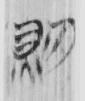則
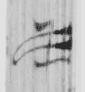民
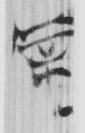厚
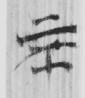不
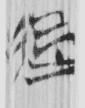起
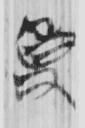事
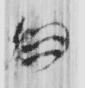於
